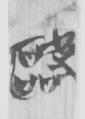歐
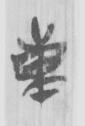東
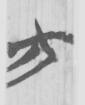方
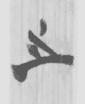之
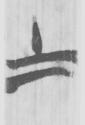士
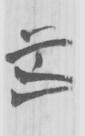正
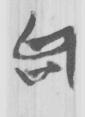句
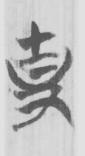吏
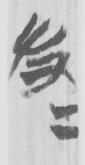{左右}=
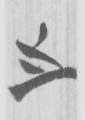之
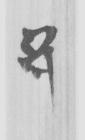邑
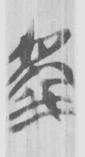虛
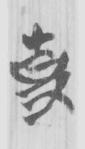吏
